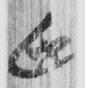臣
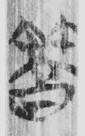{竹亯}
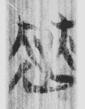勞
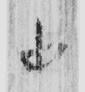中
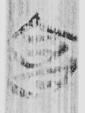合
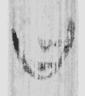曰
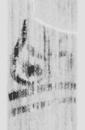爲
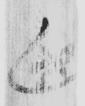臣
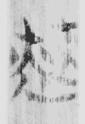勞
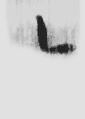才
